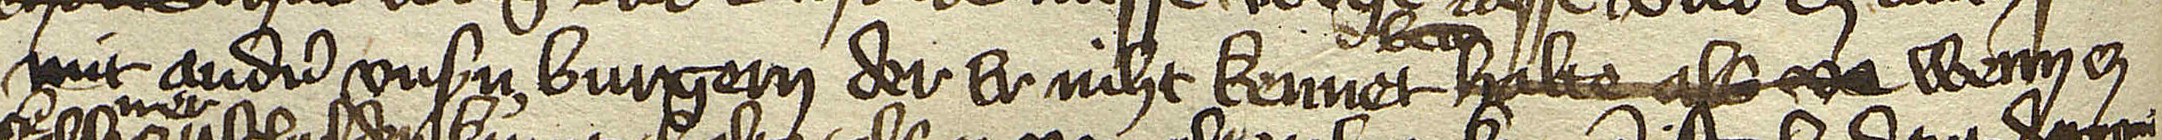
mit andn* vnſ*n burgern der Er niht kennet halte als vo wenn eʒ
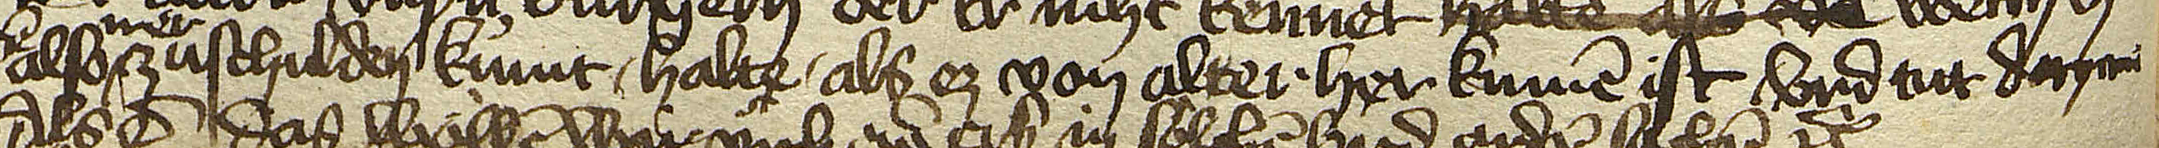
alſo cʒuſchulden kümt / halte / als eʒ von alter her kume* iſt / vnd tut darynne
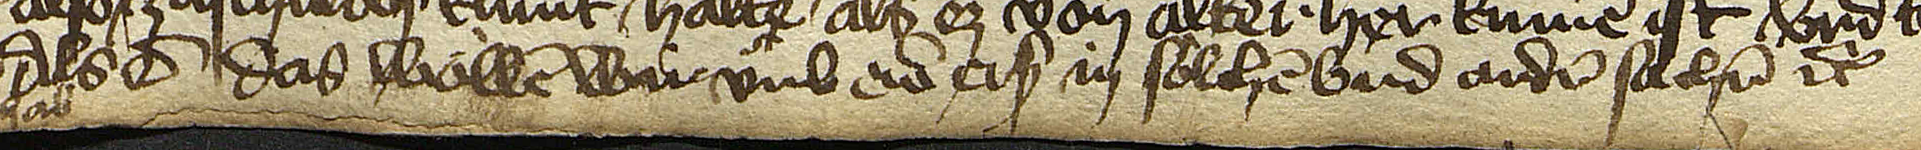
Als ec* das wölle* wir v̈mb ew* eiſ* in ſöliche* vnd andn* ſachn* ec*
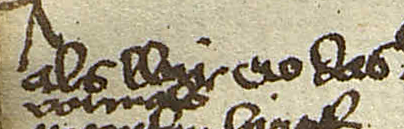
als wir ew das
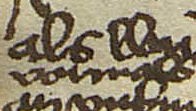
vormals
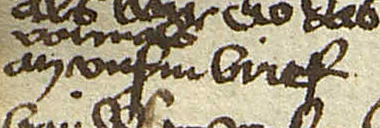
an vnſ*m brief
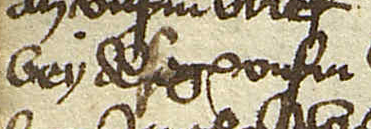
bey de* eg* vnſ*m
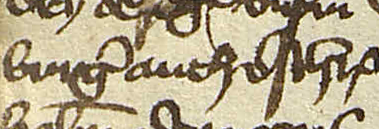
burg* auch v*ſchr*
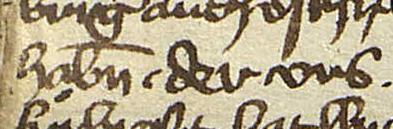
habn* / der vns
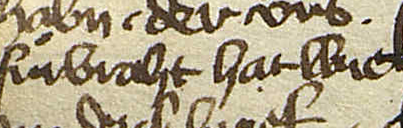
fürbraht hat wie
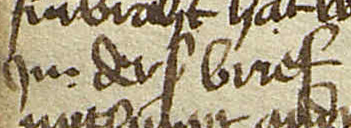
Im derſ* brief
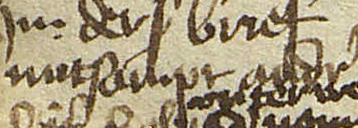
mitſampt andr*
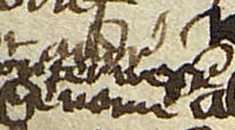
vnterwege*
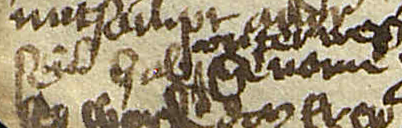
ſein* hab genome*
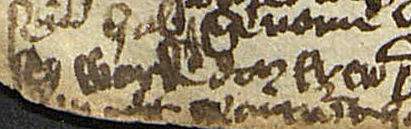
ſey worde* daʒ Er ew
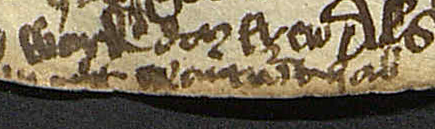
%% %%% %antwt* hab
